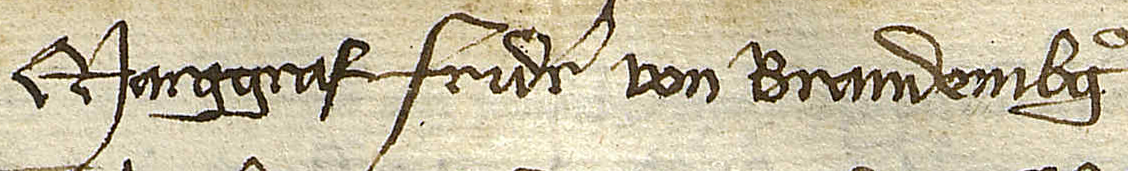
Marggraf Fridr* von Brandemb*g
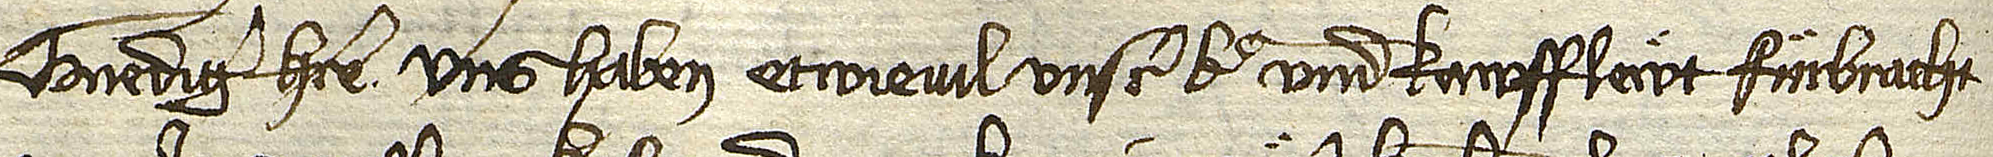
Gnedig* h*re . vns haben etwieuil vnſr* b* vnd kawfflewt fürbracht
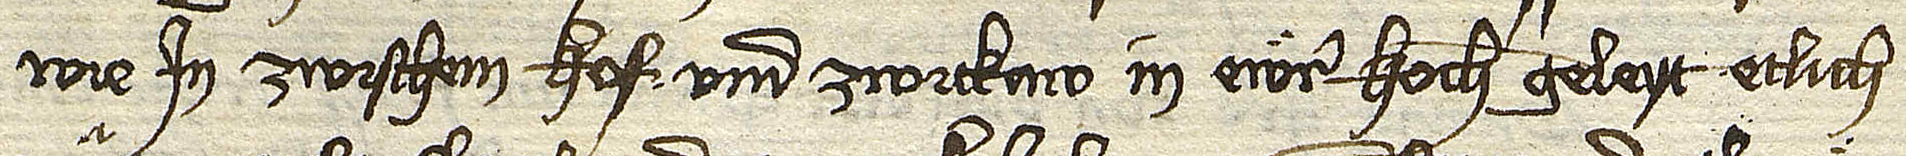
wie In ʒwiſchem hof vnd ʒwickaw in ewr* Hoch* geleyt etlich
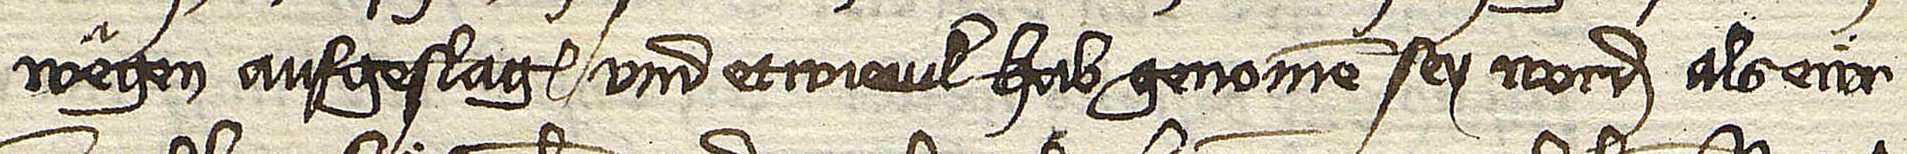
wëgen aufgeſlag* vnd etwieuil hab genome* ſey word* als ewr
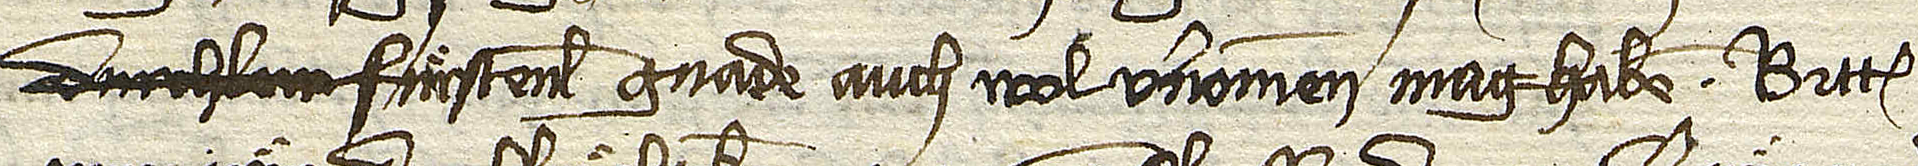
Durchlew fürſtenl* gnade auch wol v*nom*en mag habe* . Bitt*
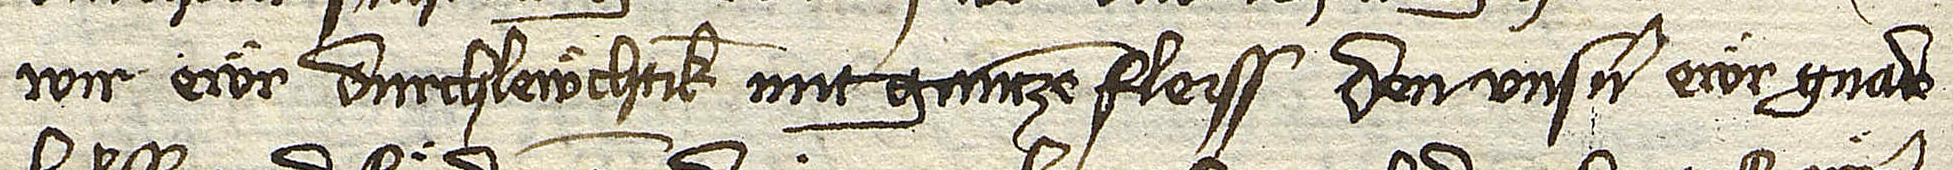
wir ewr durchlewchtik* mit gancʒe* fleiſſ den vnſn* ewr gnade
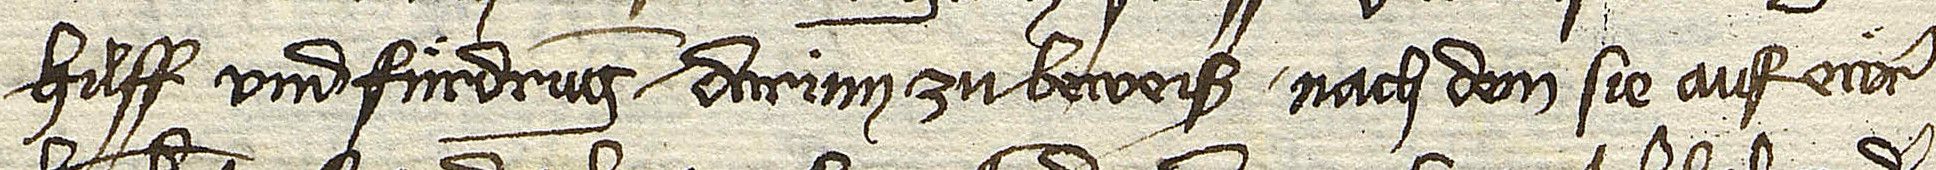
hilff vnd fürdrug* / Darinn cʒu beweiſ* / nach dem ſie auf ewr*
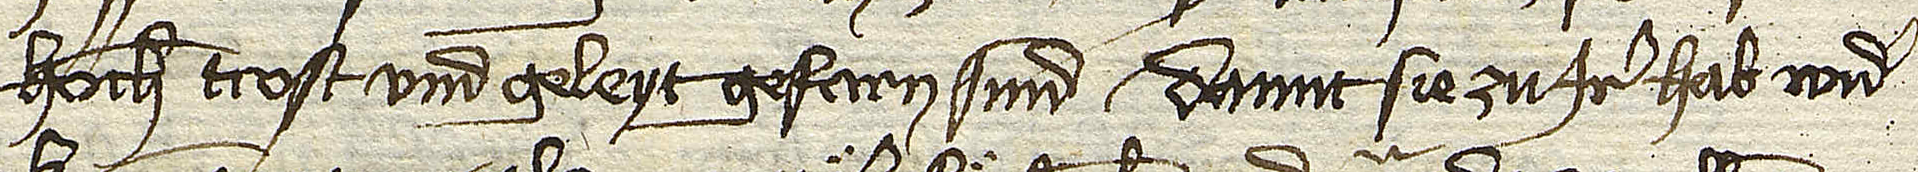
Hoch* troſt vnd geleyt gefaren ſind / Damit ſie ʒu Ir* hab wid*
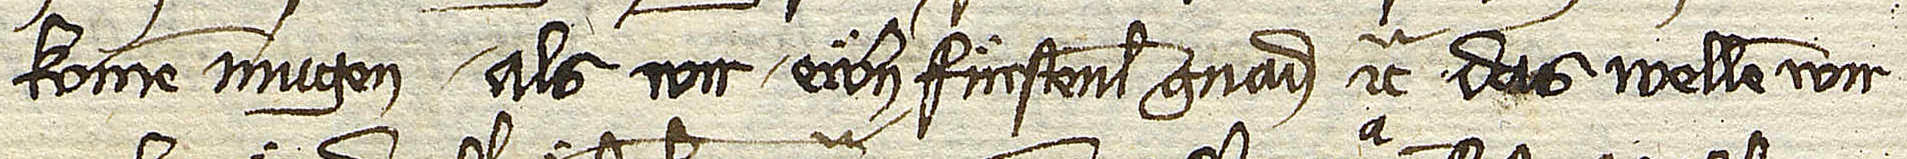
kome* mugen / als wir ew*n fürſtenl* gnad* ec* das welle* wir
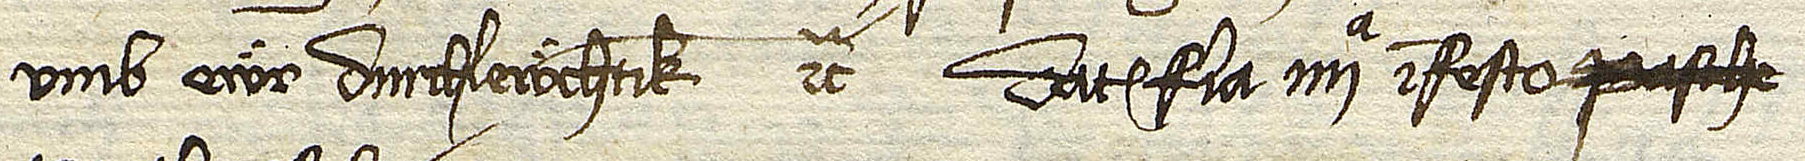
vmb ewr durchlewchtik* ec* Dat* fi*a iiii* i*feſto Paſche
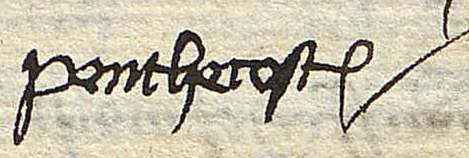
Penthecoſt* /
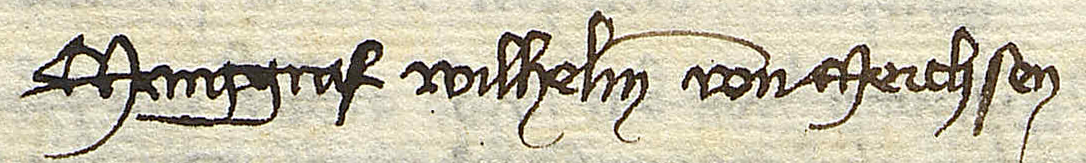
Marggraf wilhelm* von Meichſen
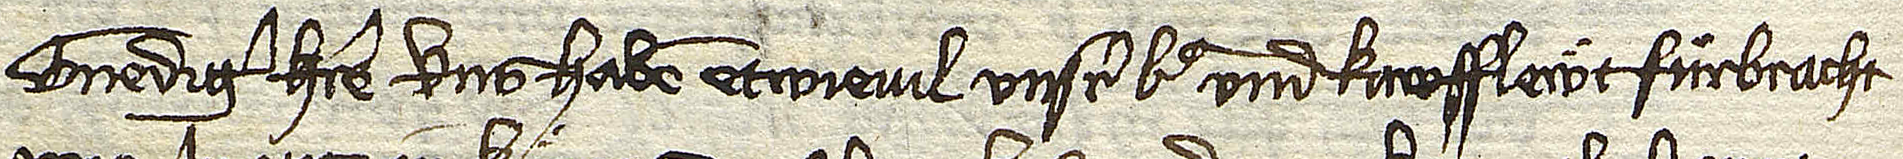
Gnedig* hr*e vns habe* etwieuil vnſr* b* vnd kawfflewt fürbracht
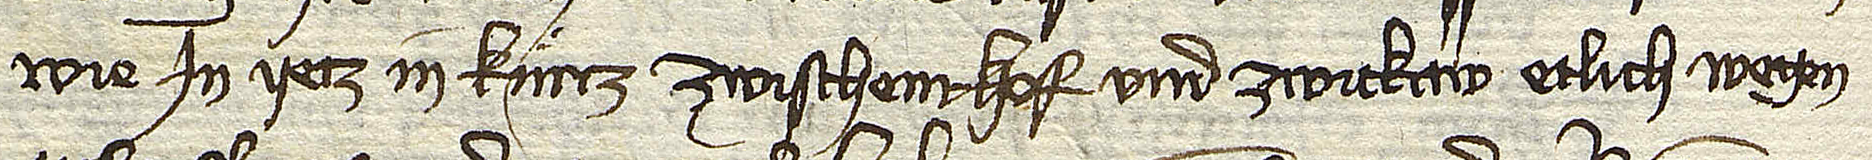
wie In yecʒ in kürcʒ ʒwiſchem hof vnd ʒwickaw etlich wegen
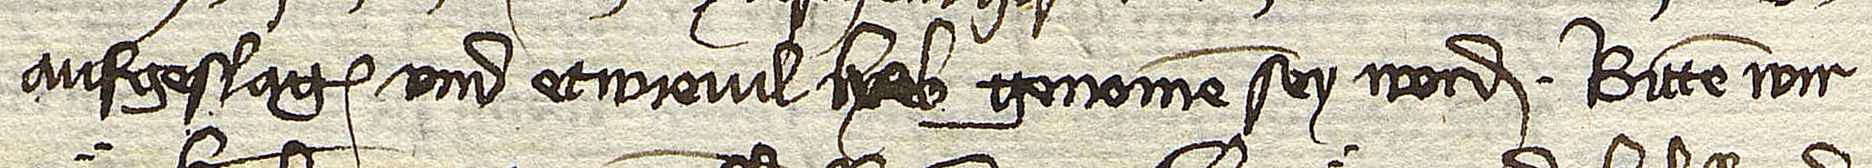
aufgeſlag* vnd etwieuil hab genome* ſey word* . Bitte* wir
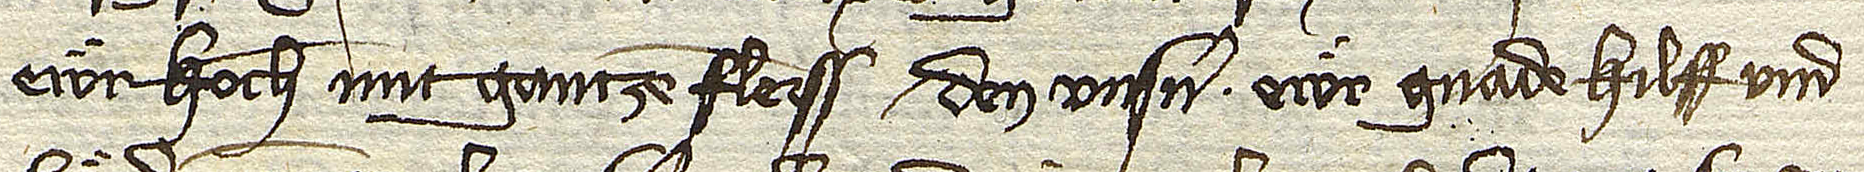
ewr Hoch* mit gancʒe* fleiſſ / den vnſn* . ewr gnade hilff vnd
